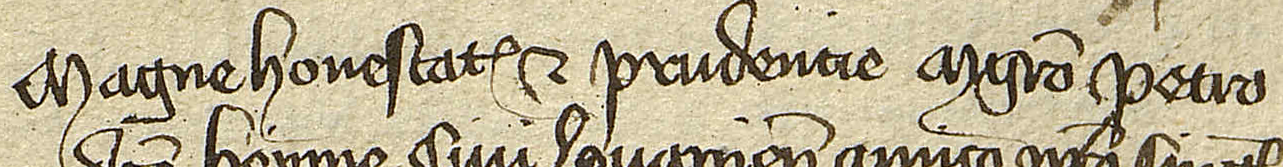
Magne honeſtat* @ prudencie M*g*ro Petro
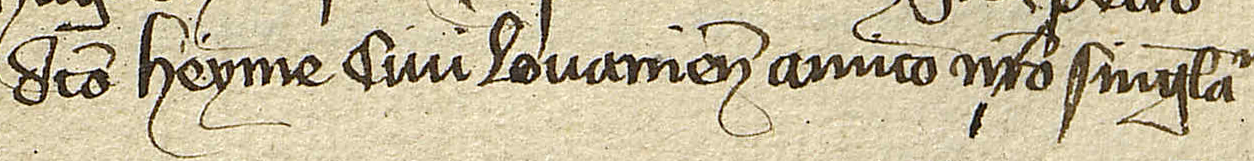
d*to Heyme Ciui Louanien* amico n*ro ſing*la*
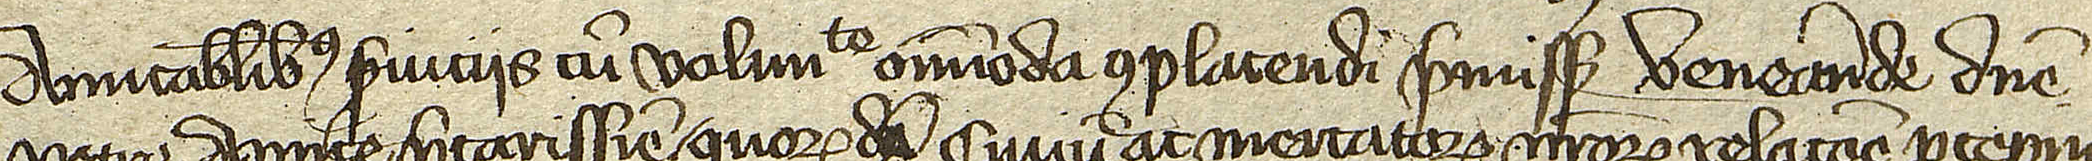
Amicab*lib* ſ*uiciis cu* volun*te om*i*oda *placendi p*miſſ*. Vene*ande d*ne
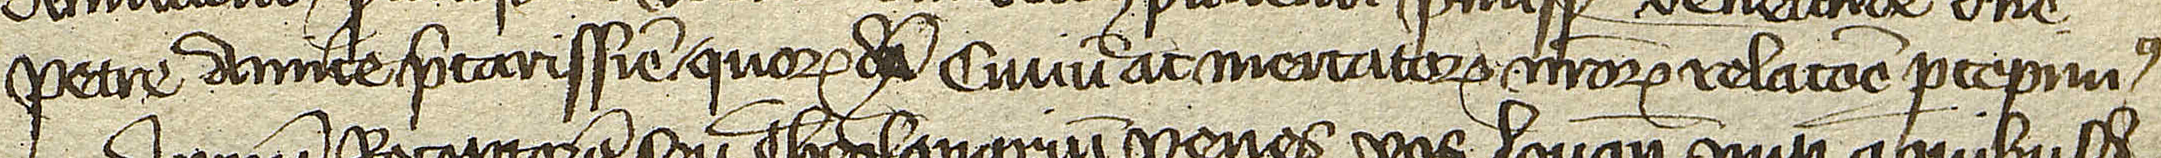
Petre Amice p*cariſſi*e / quo*da* Ciui* ac mercator* n*ro* relat*o*e p*cepim*
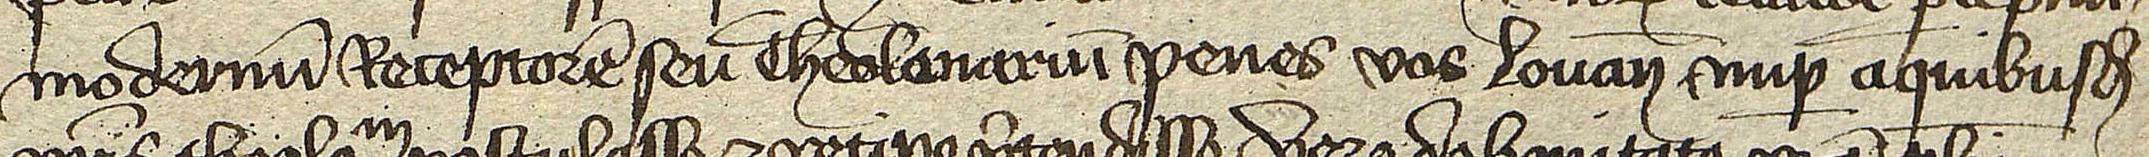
modernu* Receptore* ſeu Theolonariu* penes vos Louan* nup* a quibuſd*
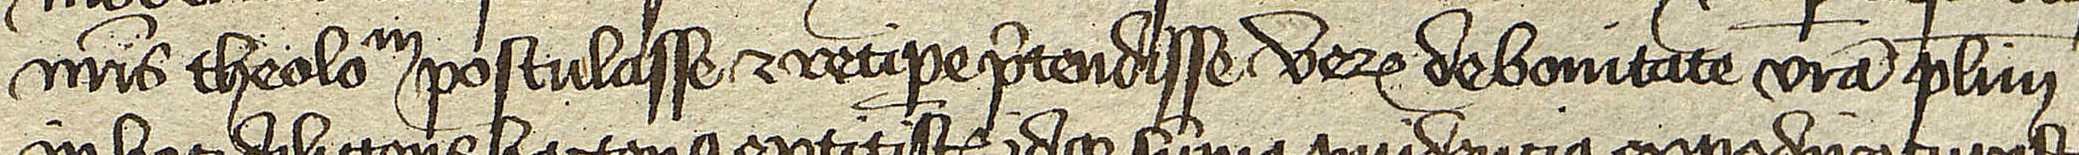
n*ris theolo* poſtulaſſe @ recip*e p*tendiſſe / Ve*r* De bonitate v*ra pl*im*
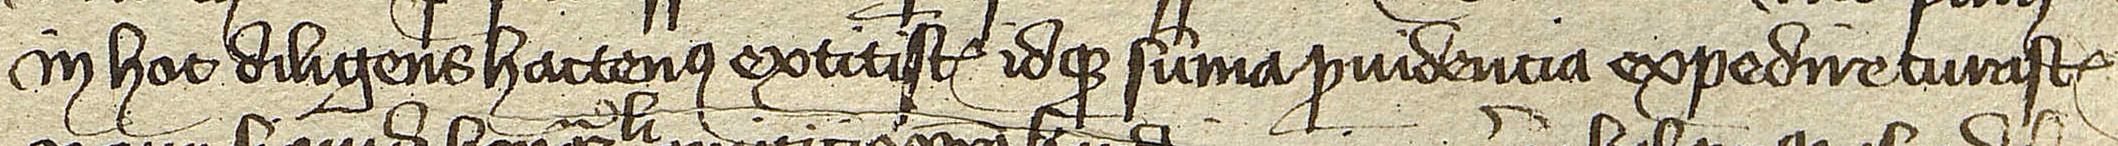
in hoc diligens hacten* extitiſt* idq* ſum*a p*uidentia expedire curaſt*
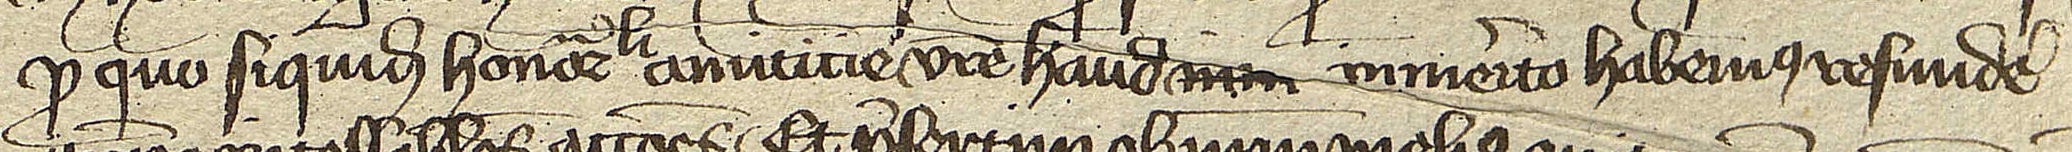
p* quo ſiquid honor* amicicie v*re haud %%%% inme*ito habem* refunde*
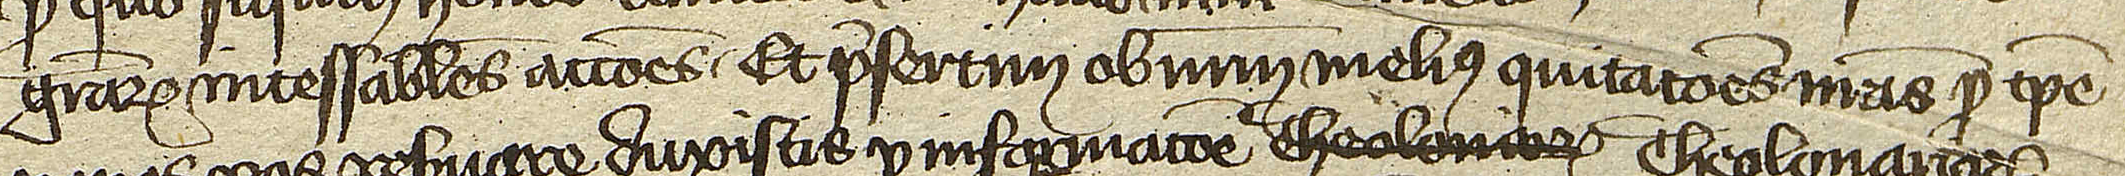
gra* inceſſab*les act*o*es / Et p*ſertim ob n*r*m meli* quitat*o*es n*ras p* t*p*e
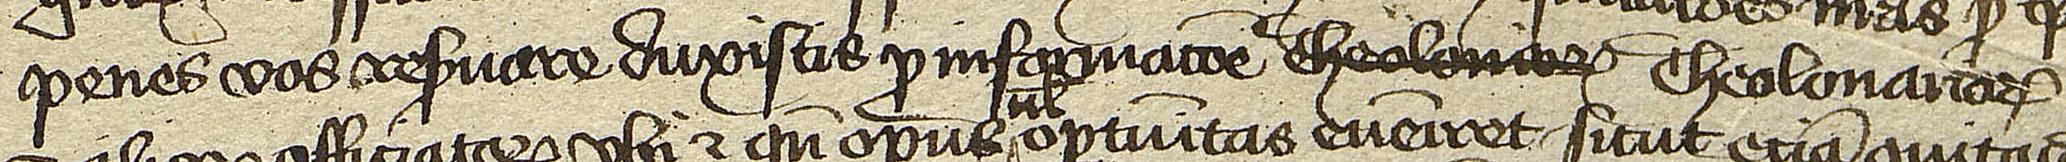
Penes vos reſ*uare duxiſtis p* informac*o*e Theolonia* theolonario*
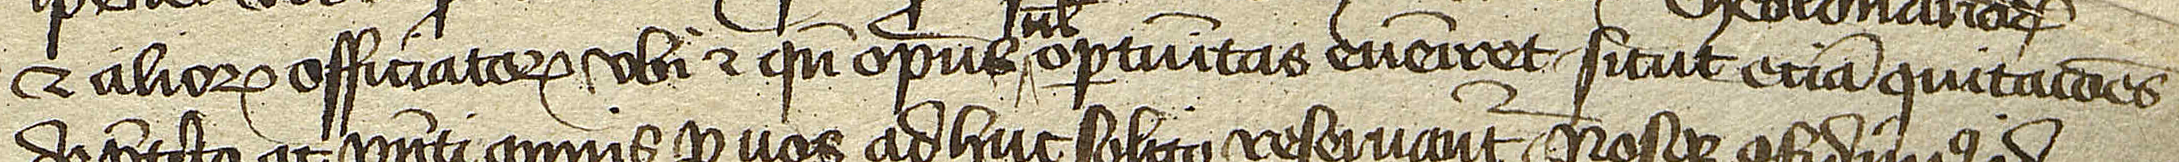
@ alio* officiato* vbi @ q*n* opus op*tu*itas eue*iret / ſicut etia* quitat*o*es
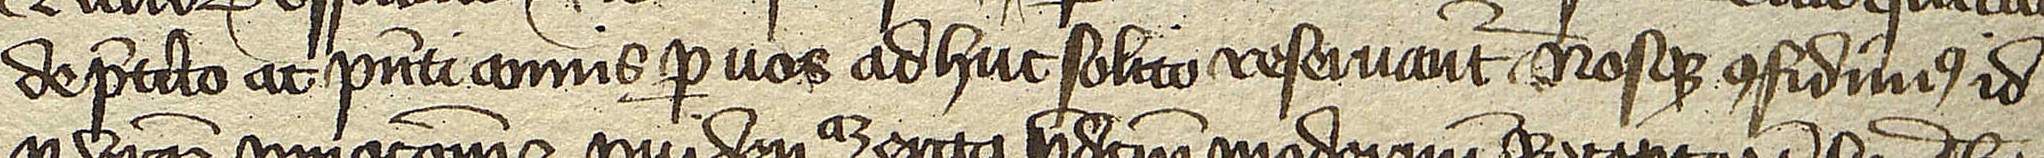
dep*t*ito ac p*nti annis p* uos adhuc ſolito reseruant* Noſq* *fidim* id
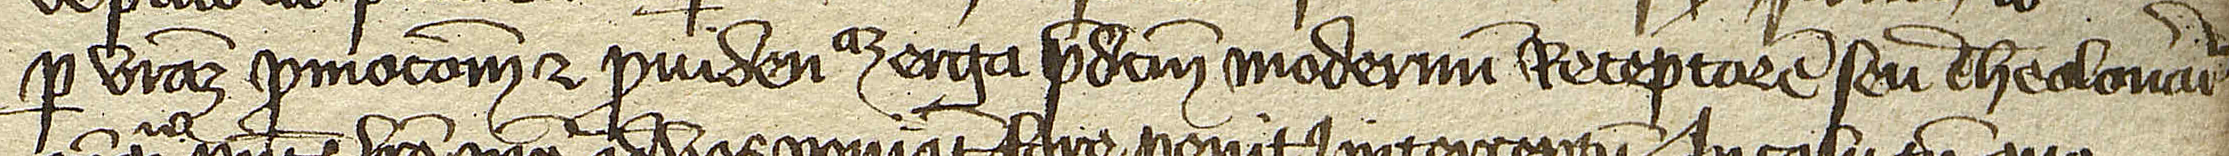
p* v*ra* p*mot*o*m @ p*uiden* erga p*d*c*m modernu* Receptore* ſeu Theolonar*
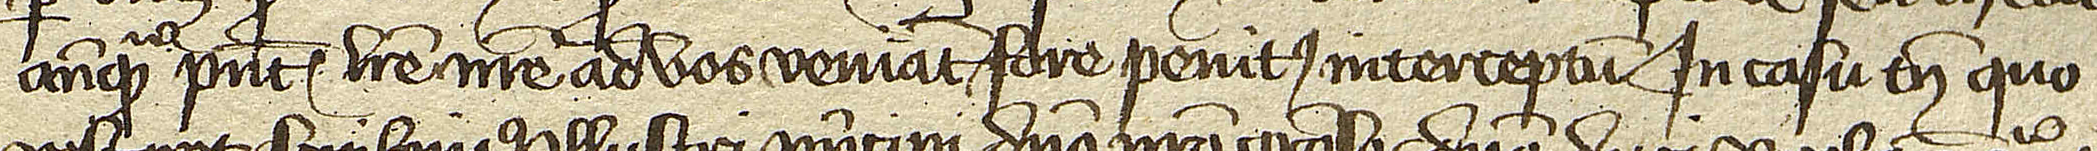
an*q* pri*t* v*re n*re ad vos veniat* fore penit* interceptu*. In caſu t*n quo
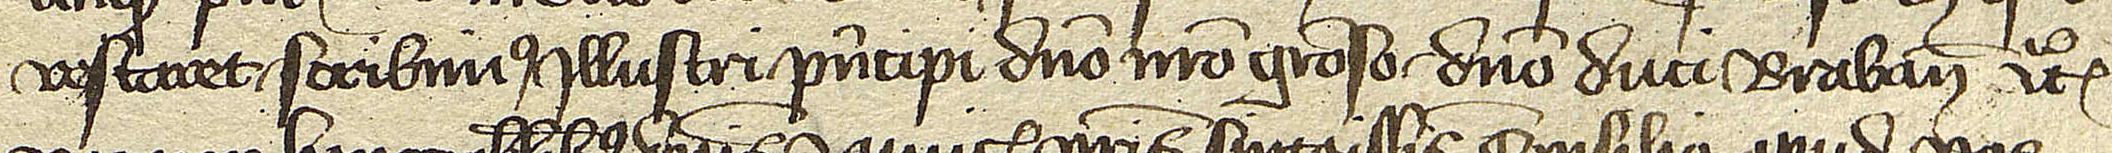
veſtaret ſcribim* lluſtri p*ncipi d*no n*ro g*r*oſo d*no duci Braban* ec*
